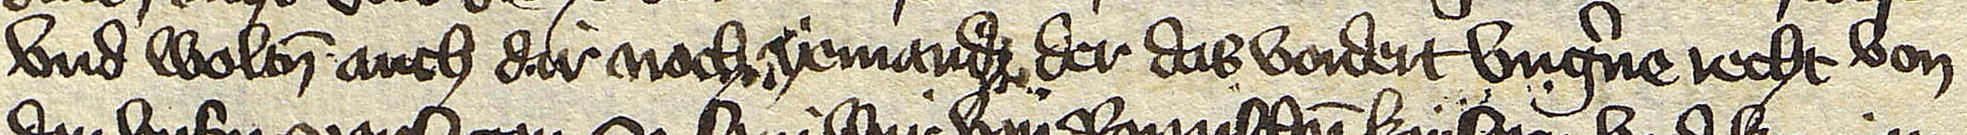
vnd woltn* auch dir noch yemand* der das vordert vng*ne recht von
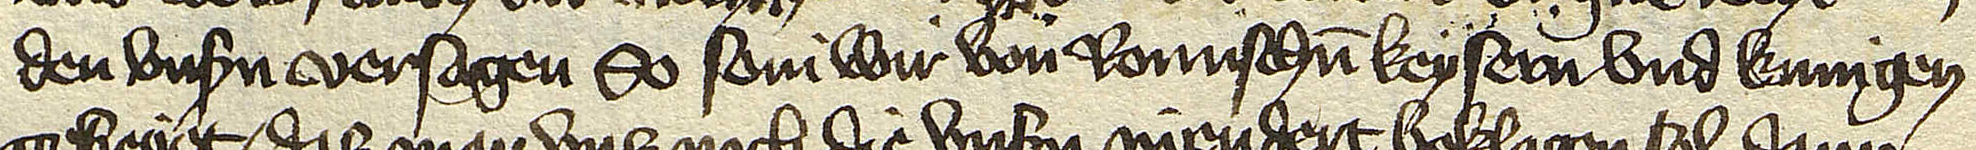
den vnſ*n verſagen So ſein wir von Romiſchn* keyſern vnd kunigen
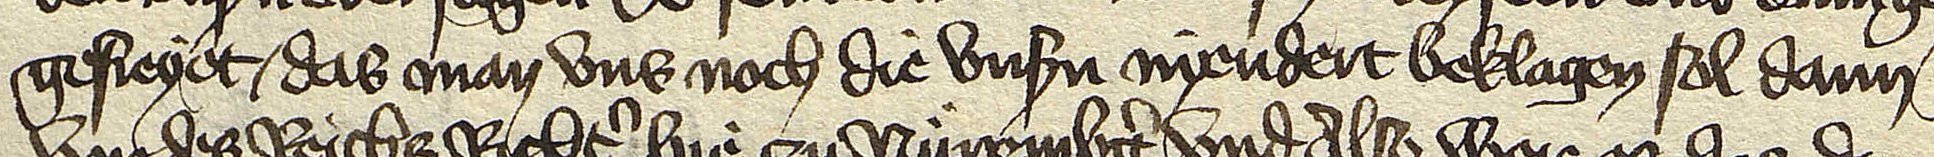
gefreyet / das man vns noch die vnſ*n nyendert beklagen ſol dann
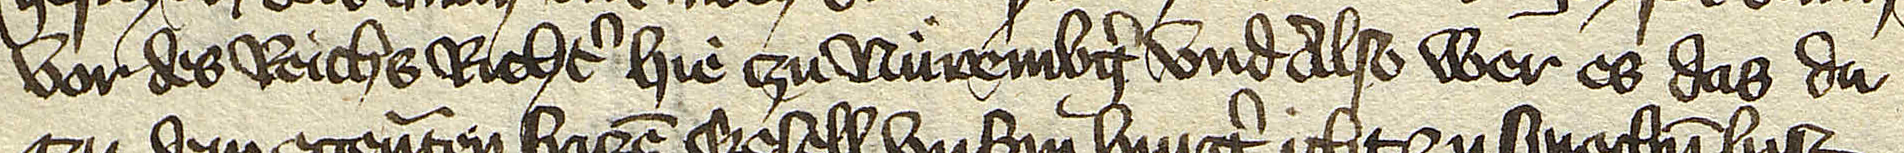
vor des Reichs Richt* hie cʒu Nürembg* vnd Alſo wer es das du
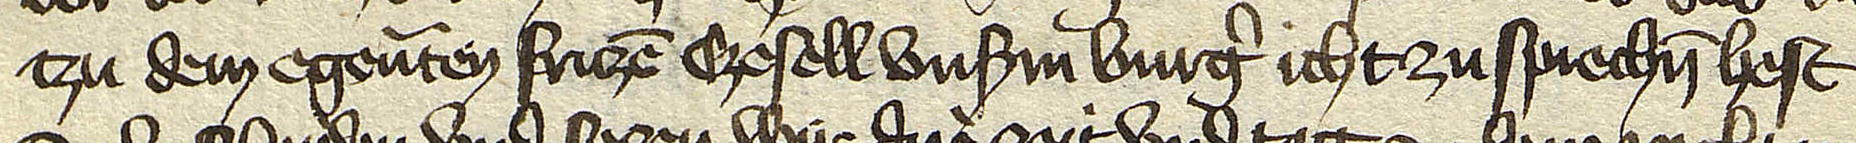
cʒu dem egenten* fricʒe* Cʒeſell vnſ*m burg* icht ʒu ſprechn* heſt
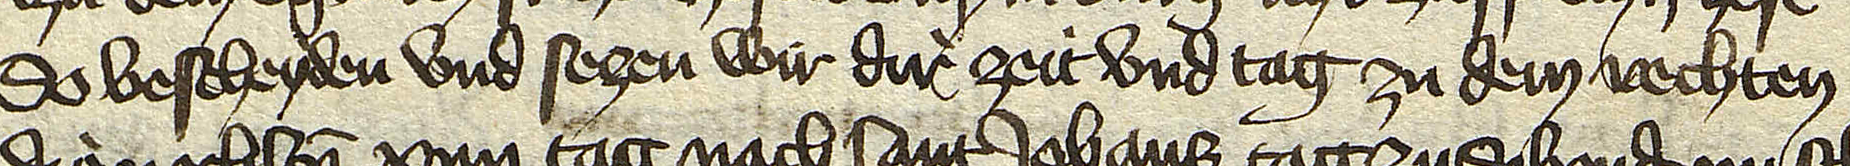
So beſcheyden vnd ſecʒen wir dir cʒeit vnd tag cʒu dem rechten
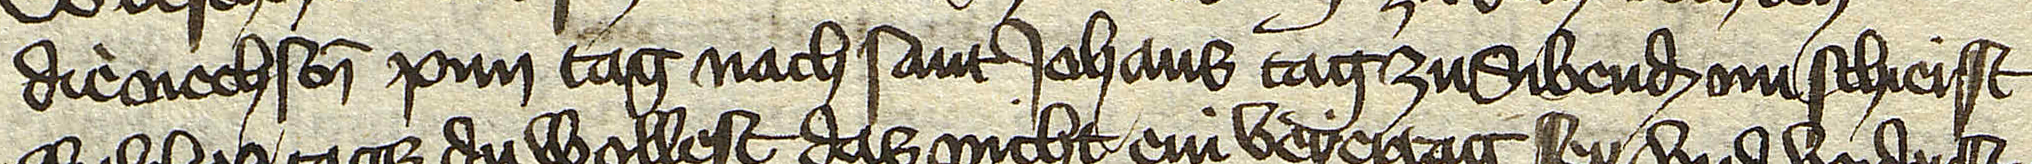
die nechſtn* xiiii tag nach ſant Iohans tag cʒu Sibend* nu ſchierſt
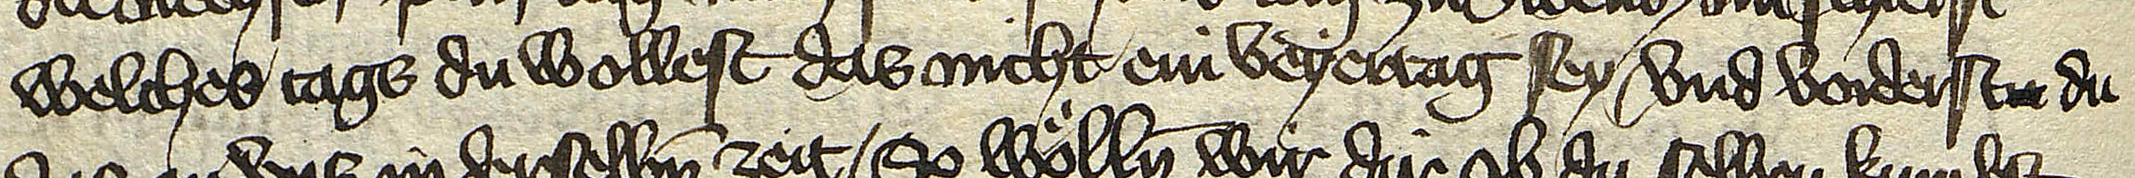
welches tags du wolleſt das nicht ein veyertag ſey / vnd vorderſtu du
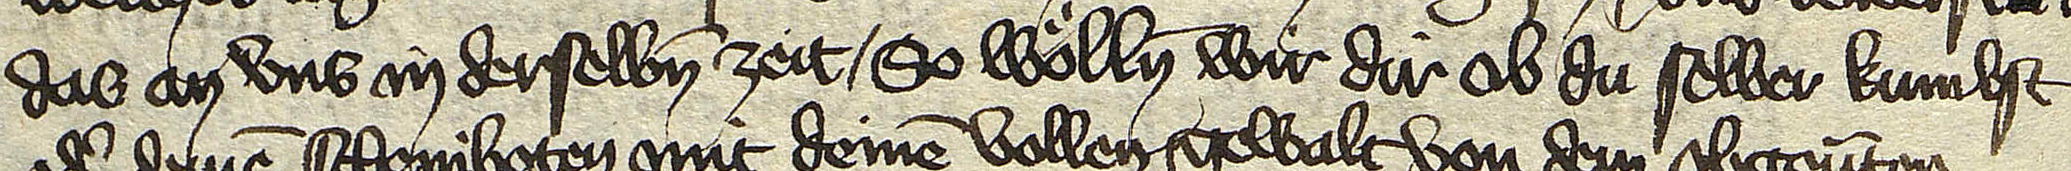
das an vns in derſelbn* cʒeit / So wölln* wir dur ob du ſelber kumbſt
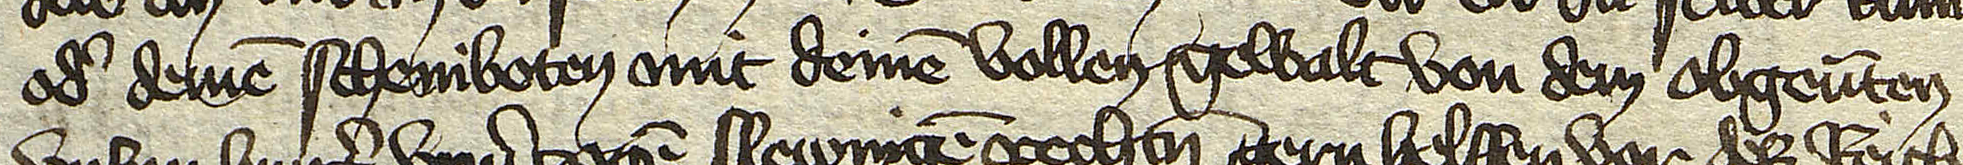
od* deine* ſcheinboten mit deine* vollen gewalt von dem obgenten *
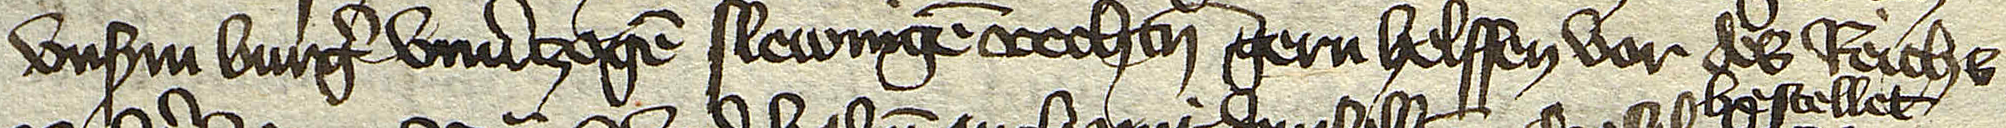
vnſ*m burg* vnu*cʒoge* ſlewnige* rechtn* gern helffen vor das Reichs
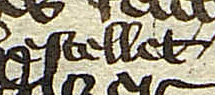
beſtellet
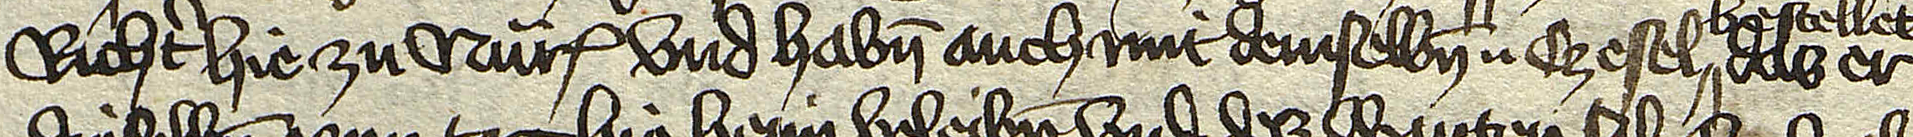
Richt* hie cʒu Nür* vnd habn* auch mit demſelbn* ~ Cʒeſel das er
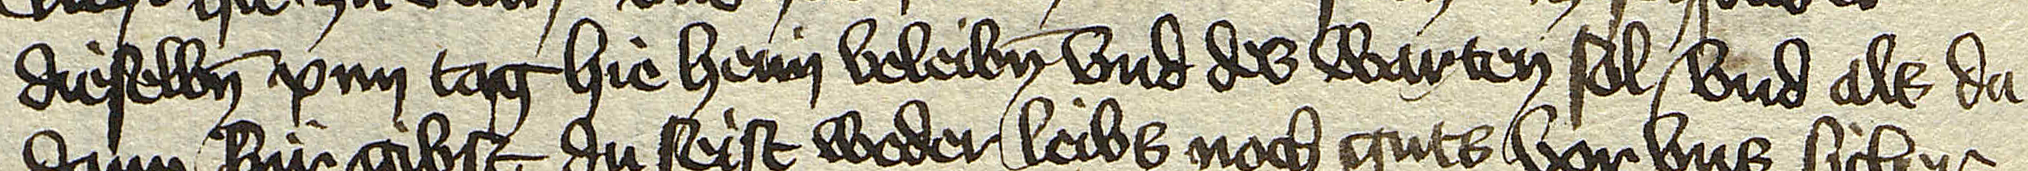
dieſelbn* xiiii tag hie heim beleibn* vnd des warten ſol / vnd als du
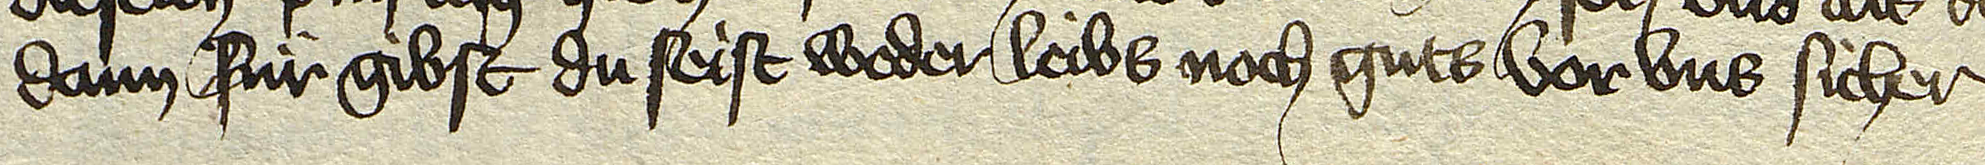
dann für gibſt du ſeiſt weder leibs noch guts vor vns ſicher
